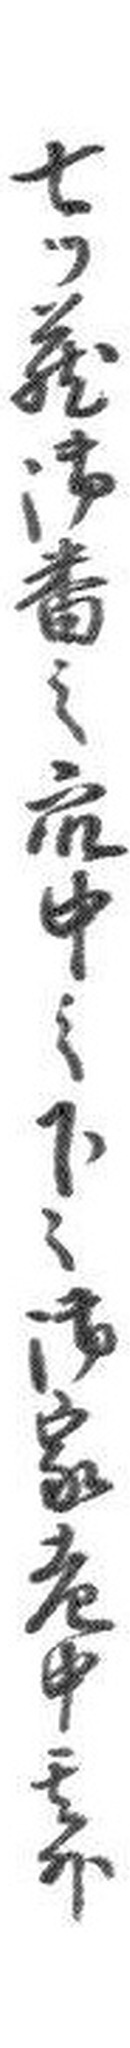七ッ蔵御番之衆中之下々御家老中其外
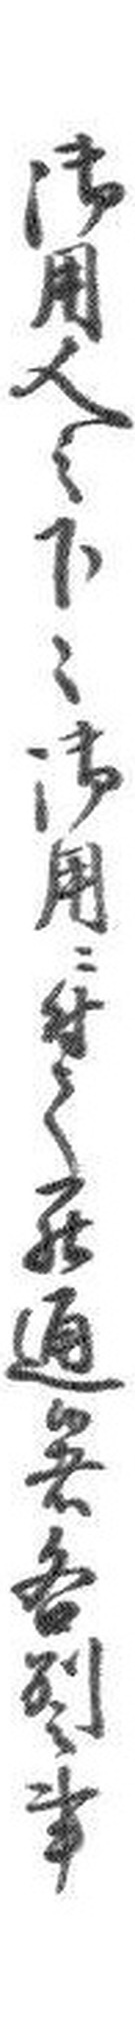御用人之下々御用ニ付て罷通候者各別之事
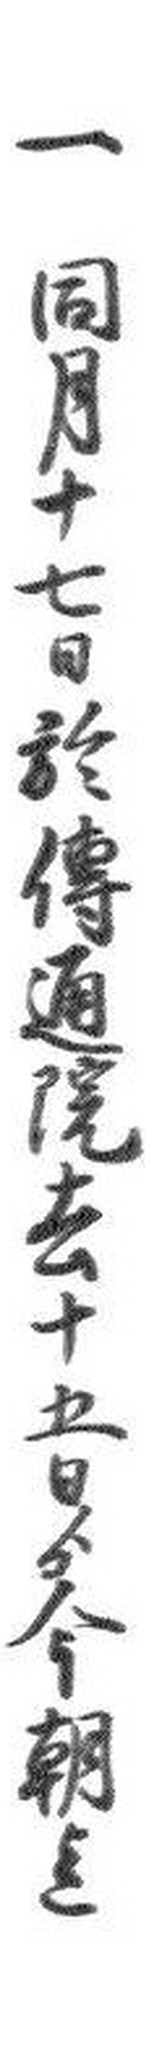一同月十七日於伝通院去十五日ゟ今朝迄
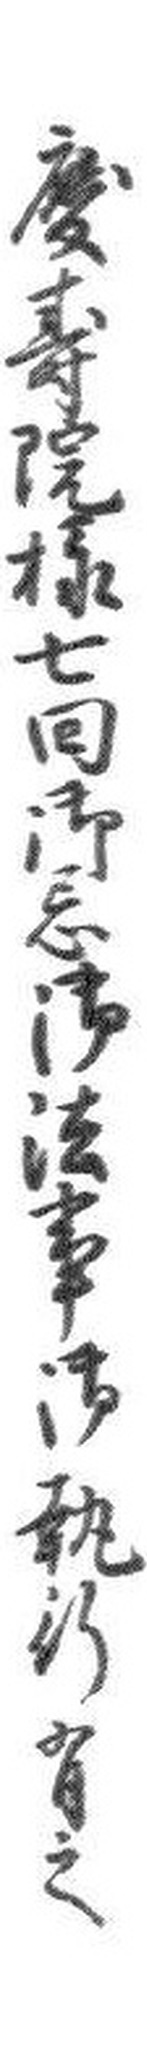慶寿院様七回御忌御法事御執行有之
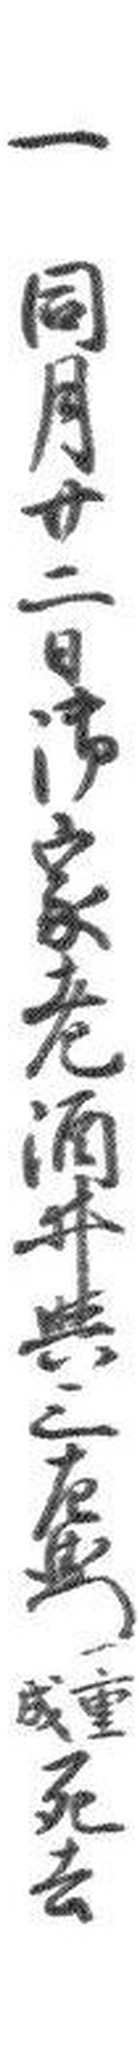一同月廿二被御家老酒井与三左衛門重成死去

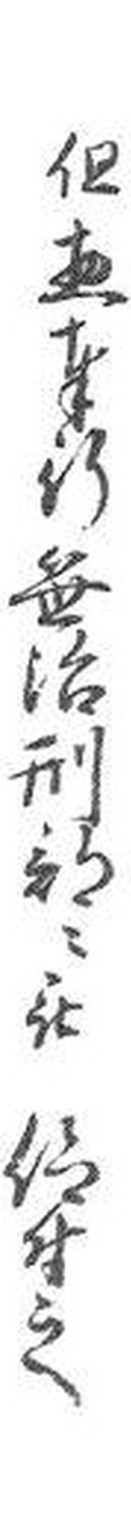但惣奉行笹治刑部ニ被仰付之
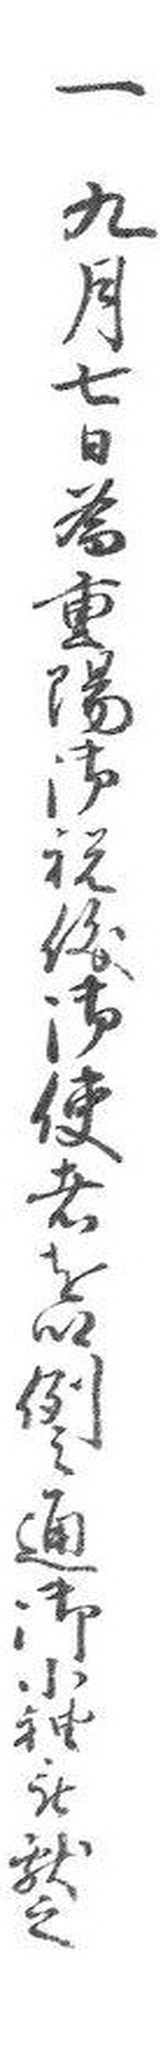一九月七日為重陽御祝儀御使者を以例之通御小袖被献之
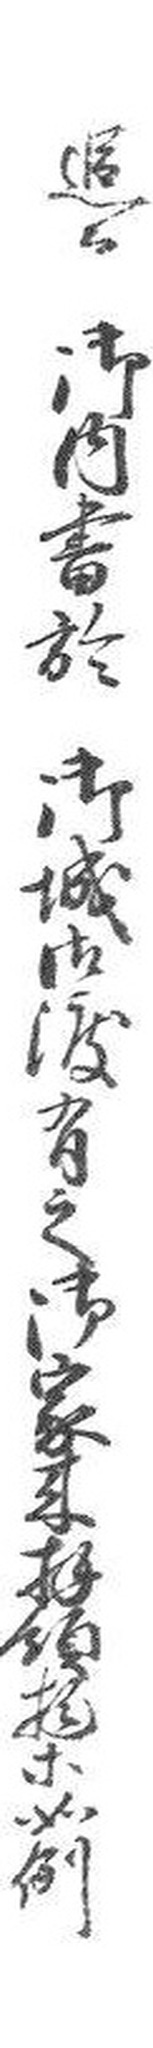追而御内番於御城御渡有之御家来拝領物等如例
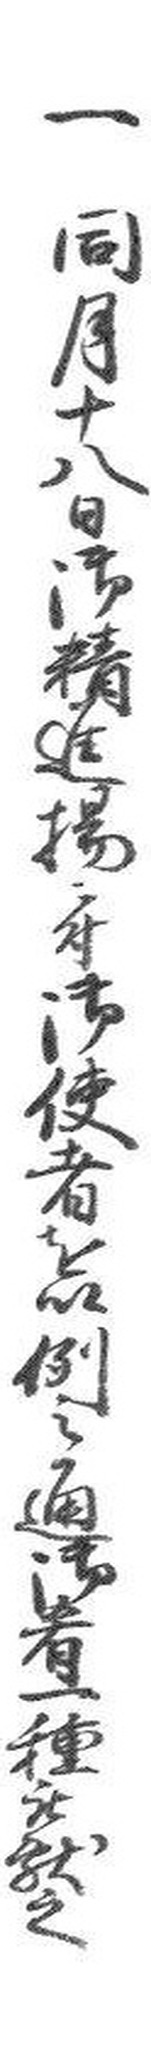一同月十八日御精進揚ニ付御使者を以例之通御肴一種被献之
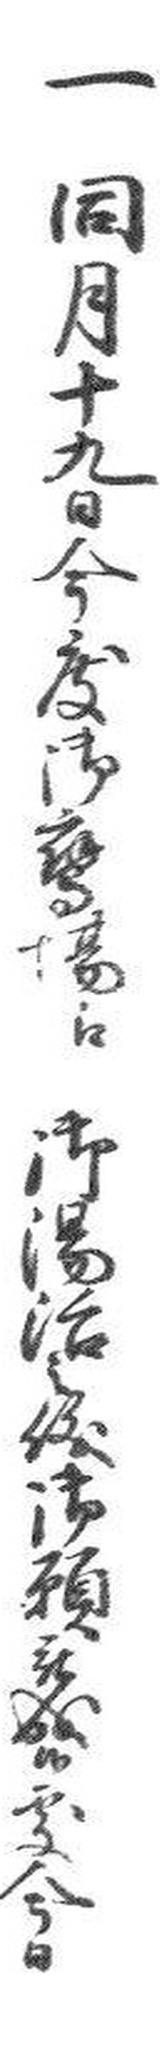一同月十九日今度御鷹場江御湯治之儀御願被成候処今日
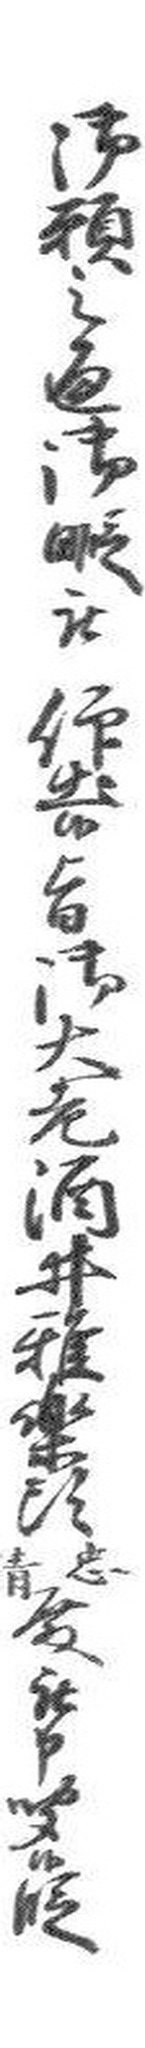御願之通御暇被仰出候旨御大老酒井雅楽頭忠清殿被申聞く候段
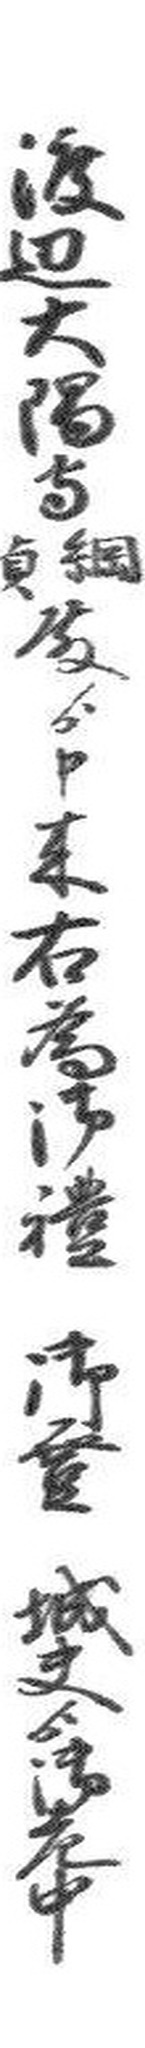渡辺大隅守綱貞殿ゟ申来為右御礼御登城夫ゟ御老中
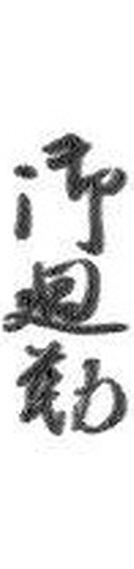御回勤
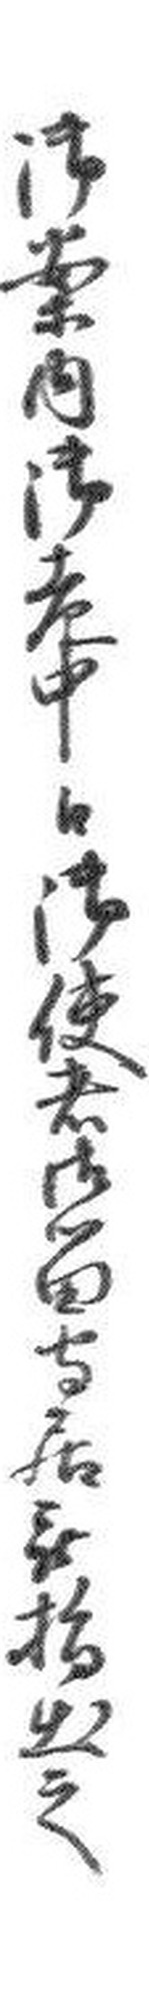御案内御老中江御使者御留守居被指出之
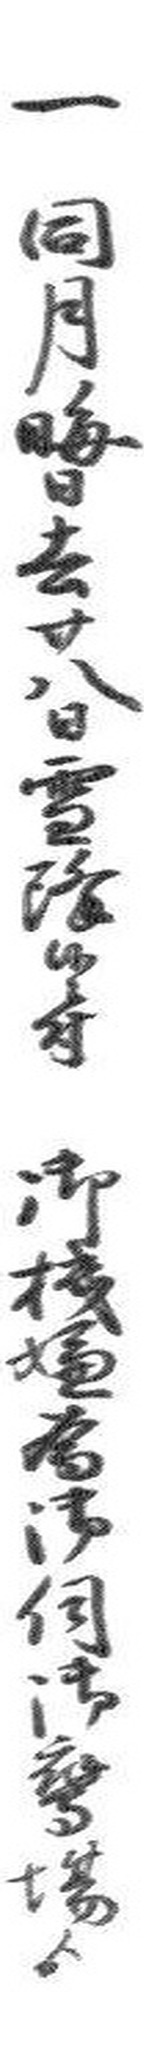一同月晦日去廿八日雪降候ニ付御機嫌為御伺御鷹場ゟ
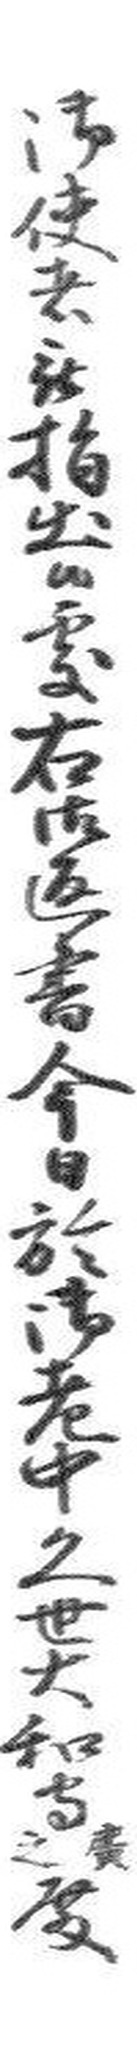御使者被指出候処右御返書今日於御老中久世山城守広之殿
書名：家譜 七 光通公 従寛文四年到同九年
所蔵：福井県文書館 Fukui Prefectural Archives
